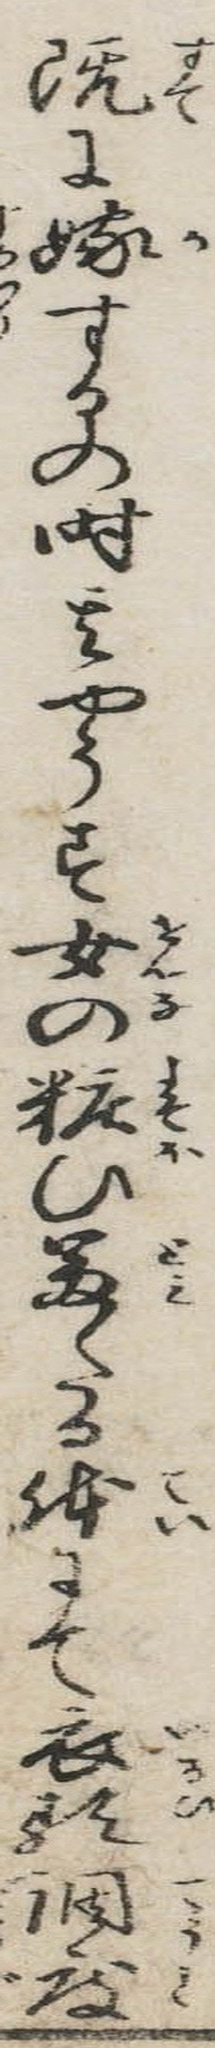既に嫁するの時其やうす女の粧ひ冨たる体にて衣類調度
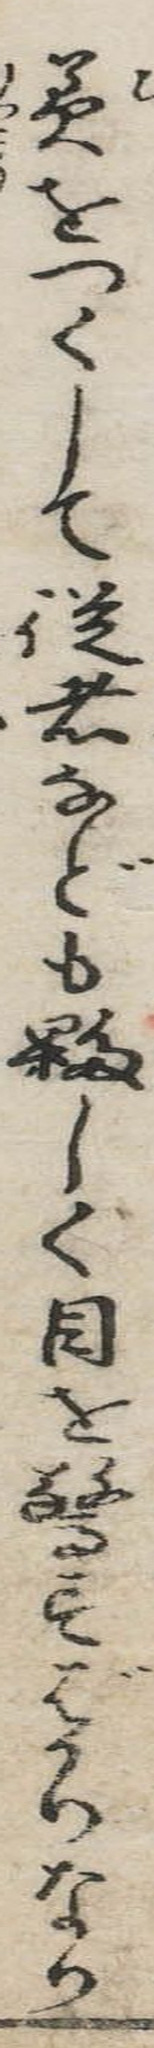美をつくして従者なども夥しく目を驚すばかりなり
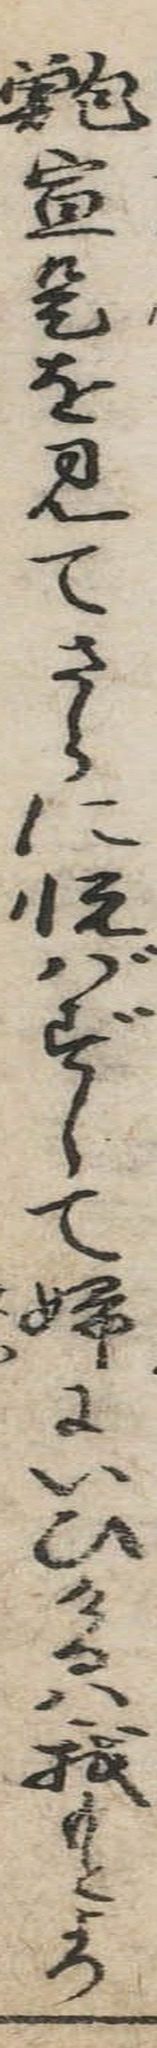鮑宣是を見てさらに悦ばずして婦にいひけるは我もとより

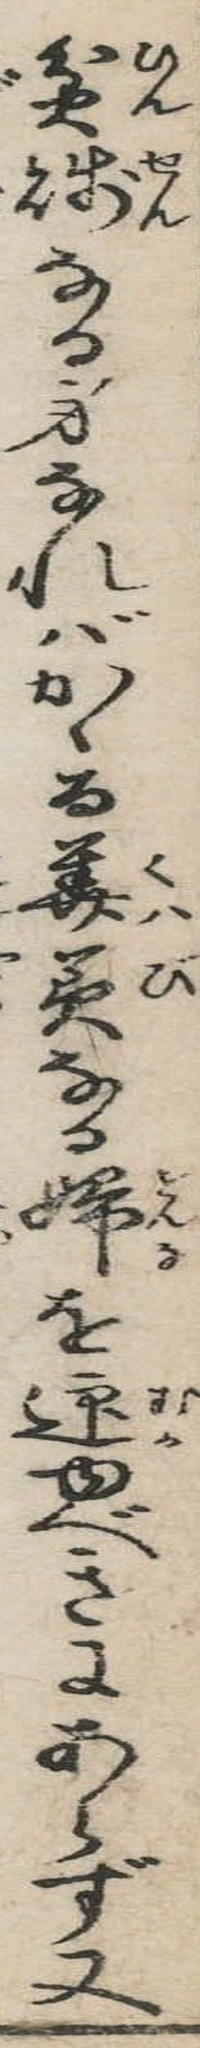貧賤なる身なればかゝる華美なる婦を迎ゆべきにあらず又
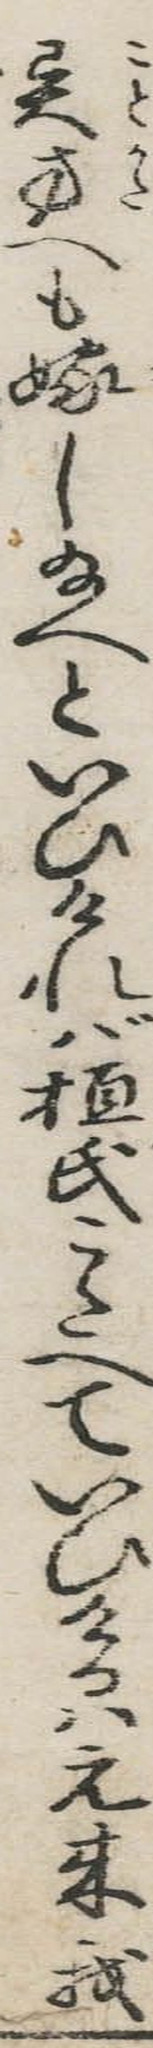異方へも嫁し給へといひければ桓氏こたへていひけるは元来我
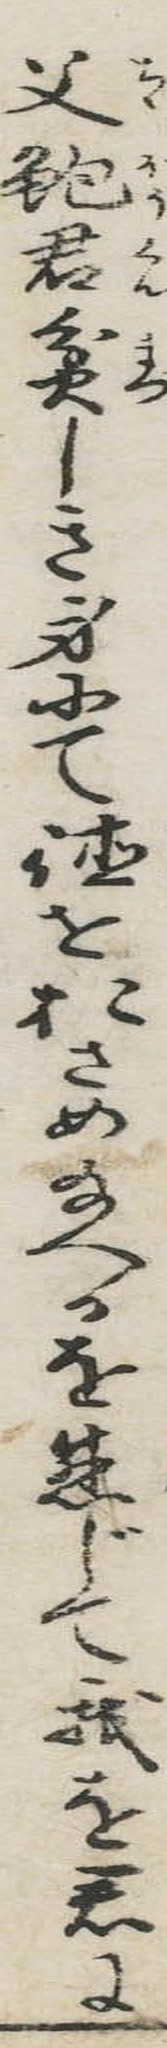父鮑君貧しき身にて徳をおさめ給へるを感じて我を君に
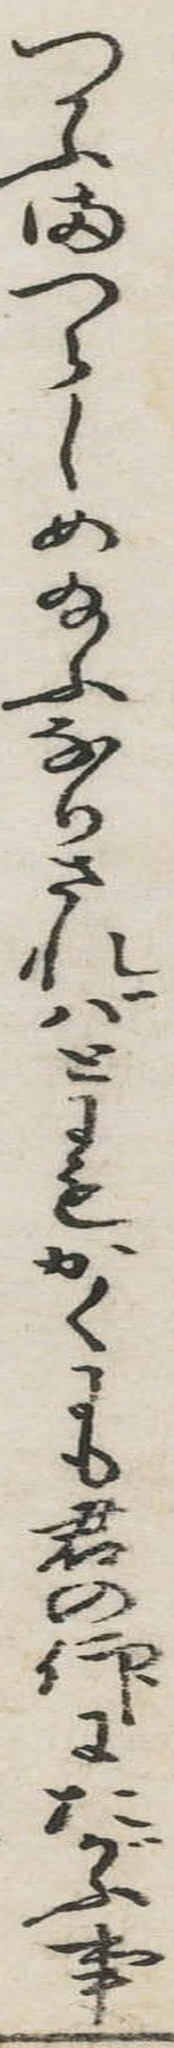つかふまつらしめ給ふなりさればとにもかくにも君の仰にたがふ事
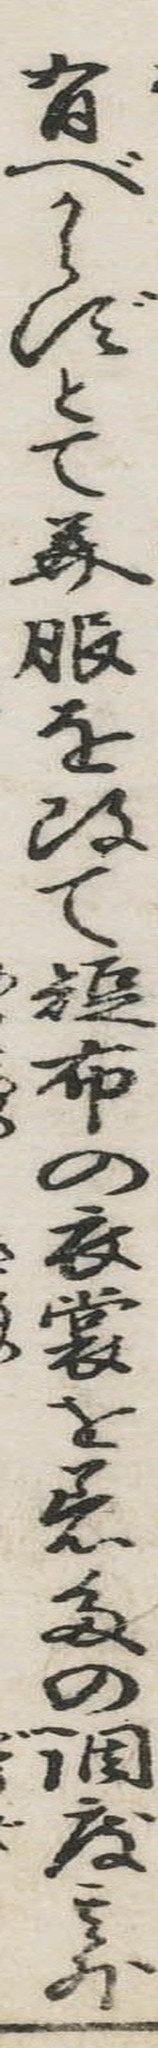有べからずとて美服を改て短布の衣裳を着多の調度其外
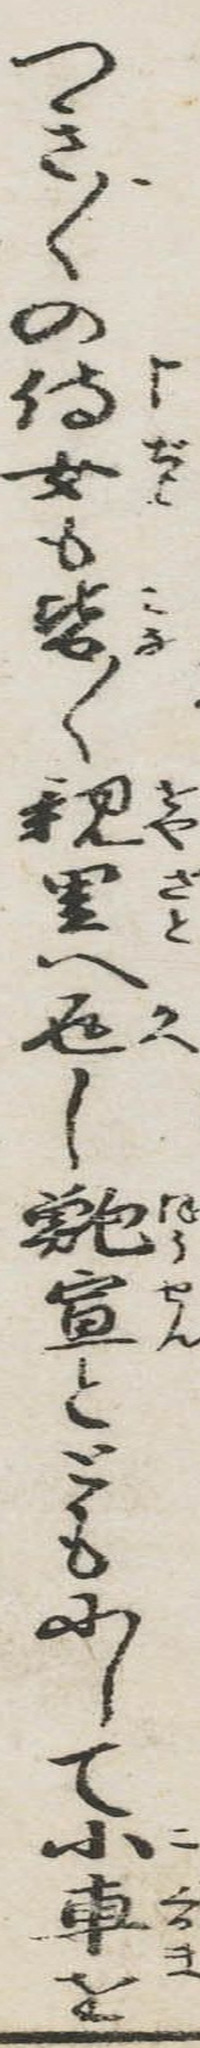つき〳〵の侍女も皆〳〵親里へ返し鮑宣とともにして小車を
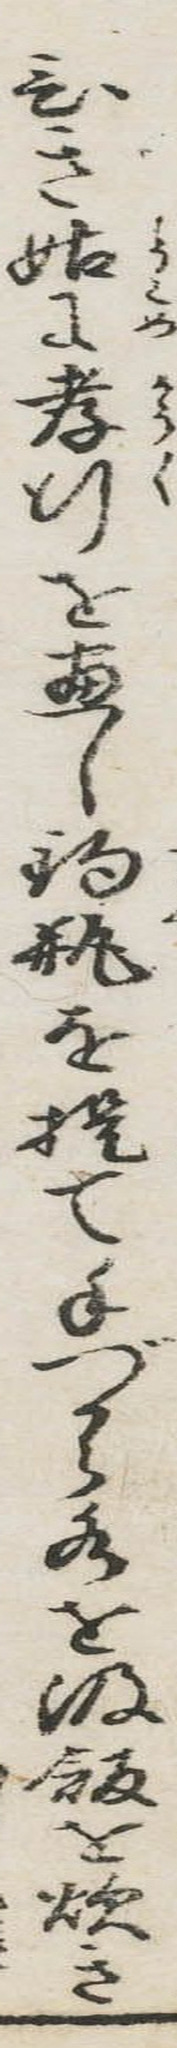ひき姑に孝行を尽し釣瓶を提て手づから水を汲飯を炊き
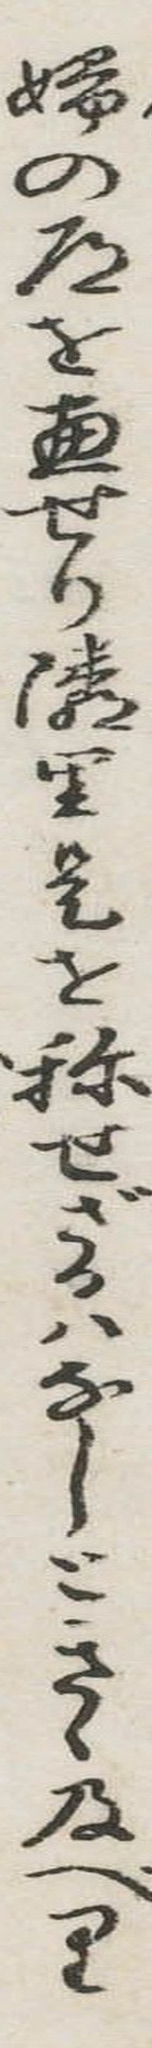婦の道を尽せり隣里是を称せざるはなしときゝ及べり
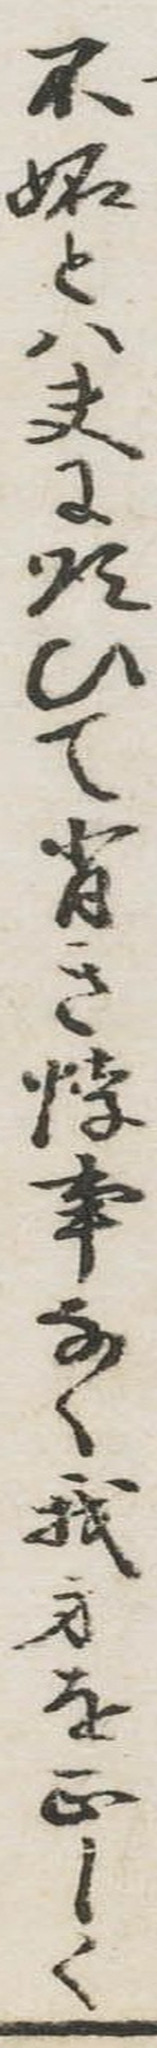不妬不妬とは夫に順ひて背き悖事なく我身を正しく
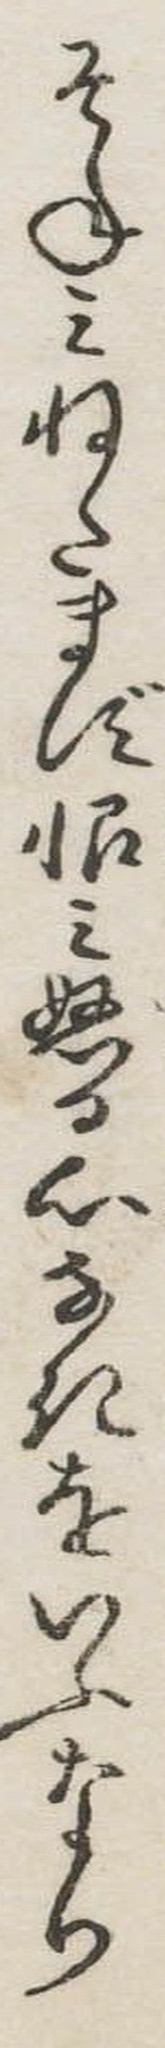そねみねたまず恨み怒る心なきをいふなり
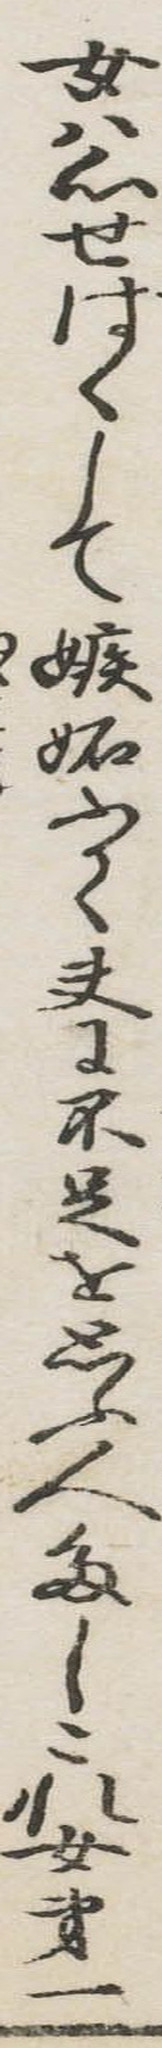女は心せばくして嫉妬ふかく夫に不足を思ふ人多しこれ女第一
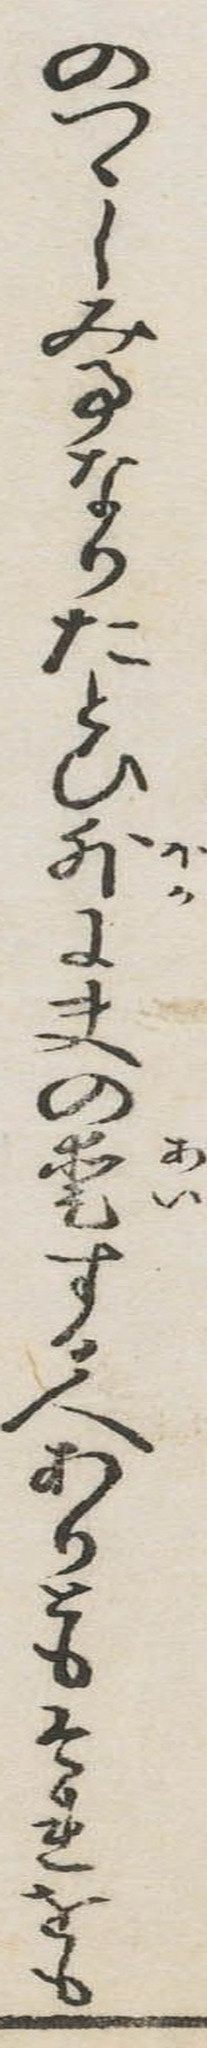のつゝしみなりたとひ外に夫の愛する人ありともそれをも
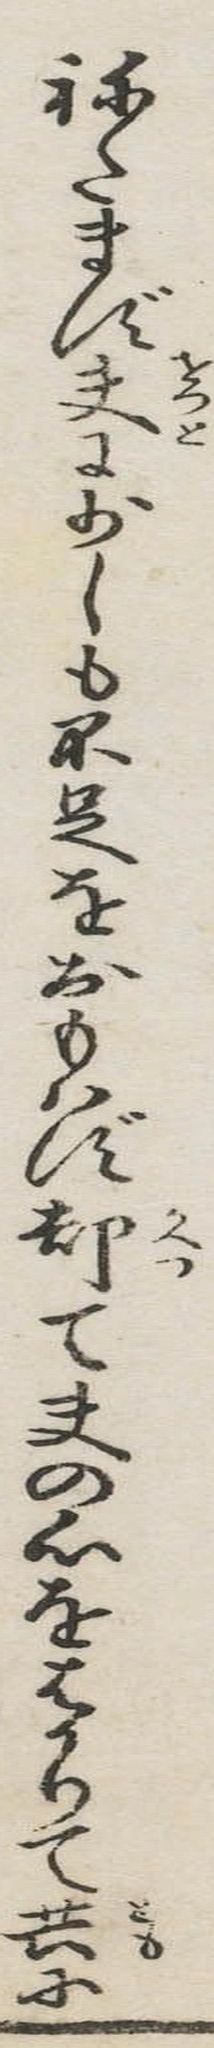ねたまず夫に少しも不足をおもはず却て夫の心をはかりて共に
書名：前訓
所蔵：東京学芸大学附属図書館
